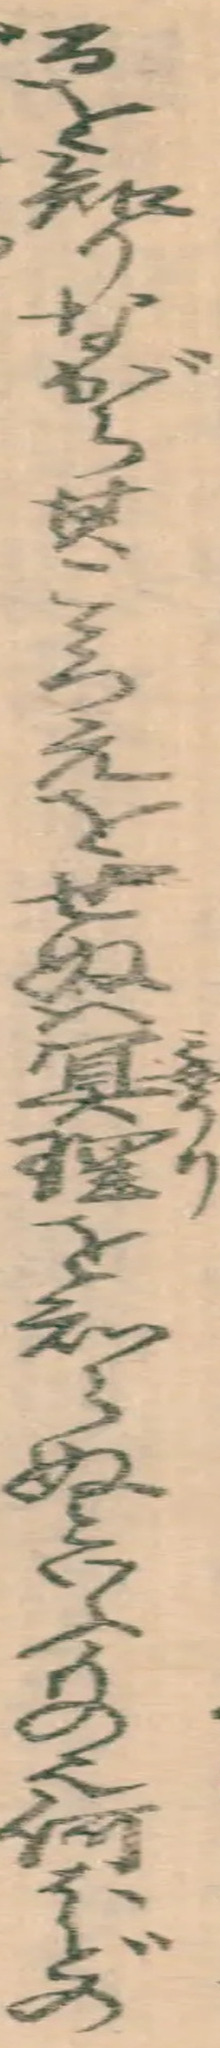るを知りながら其こゝろえをせぬは冥理を知らぬといふもの也何ほどの
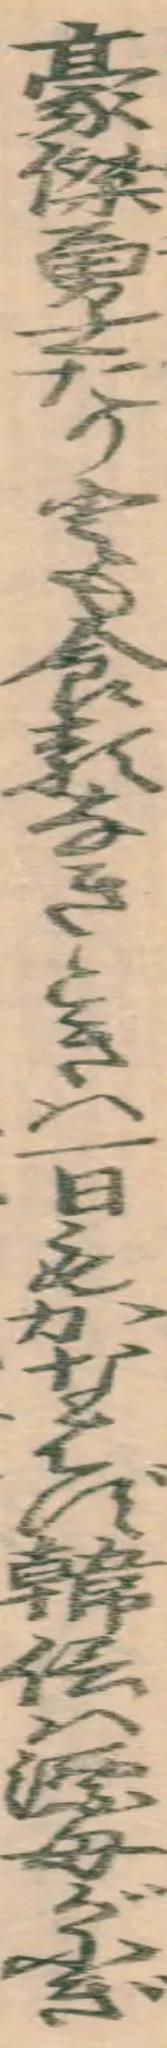豪傑勇士たりとも食類なきときは一日もかなはず韓信は漂母がにぎ
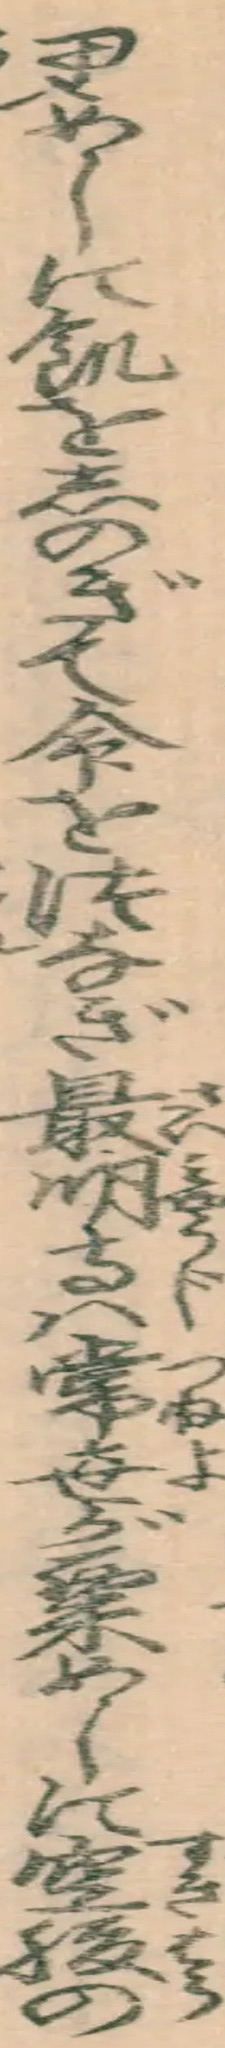りめしに飢をしのぎて命をつなぎ最明寺は常世が粟めしに空腹の
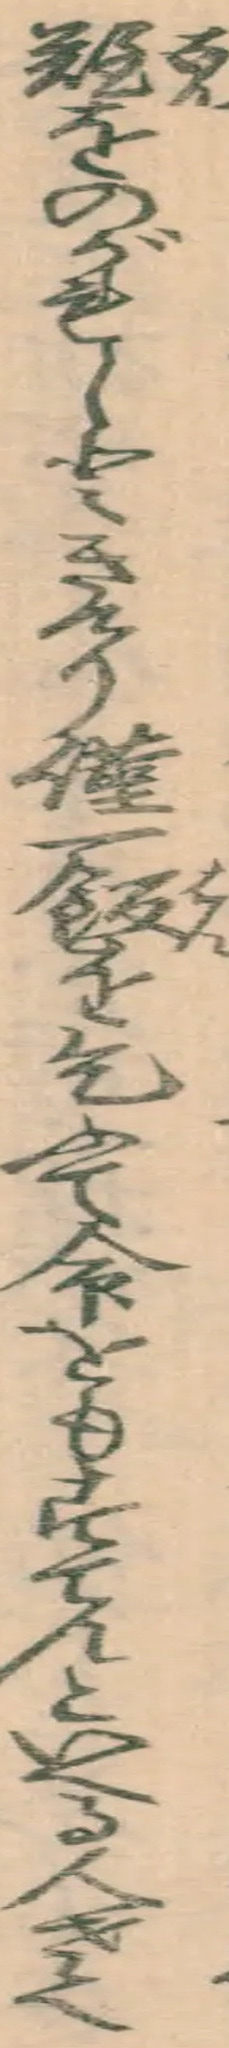難をのがれしときけり僅一飯を乞ふて命をもすてんといへる人さへ
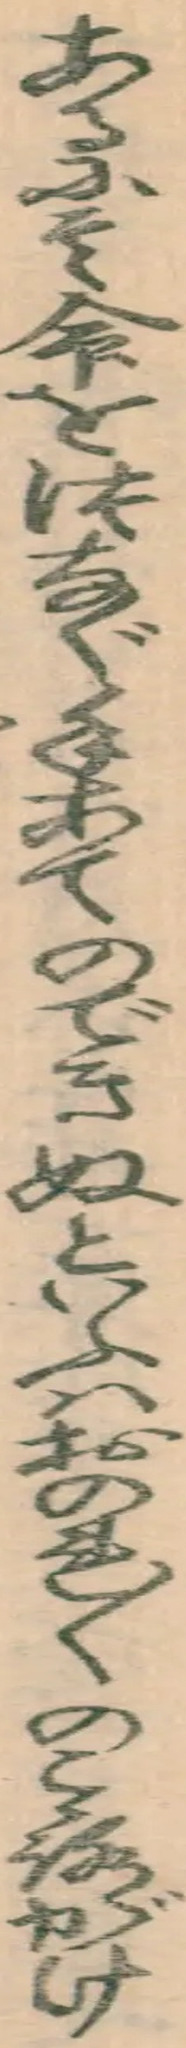あるに其命をつなぐ手あてのできぬといふはおのれ〳〵のこゝろがけ
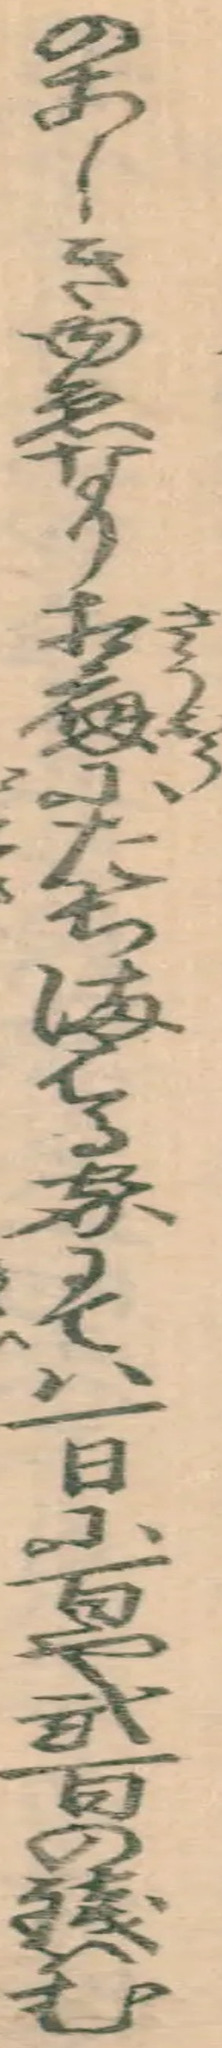のあしきゆゑなり相応にたちまはる家にては一日に百や弐百の銭はむ
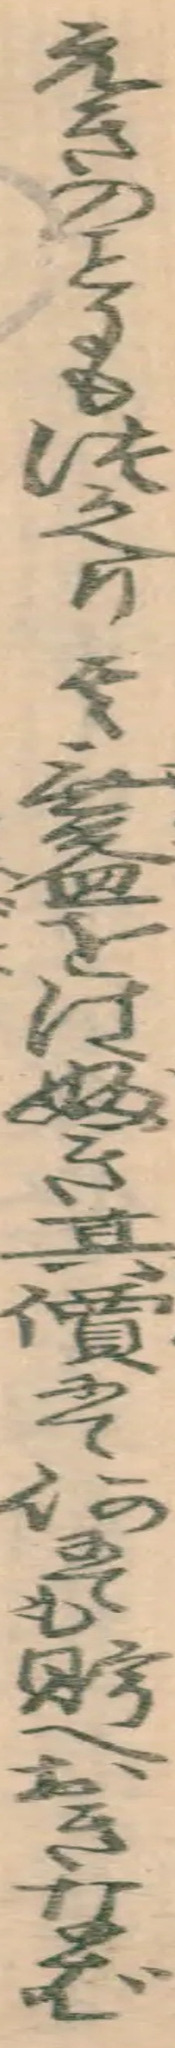えきのことにもつかへり其無益をはぶき其價にて何にても貯へおきなば
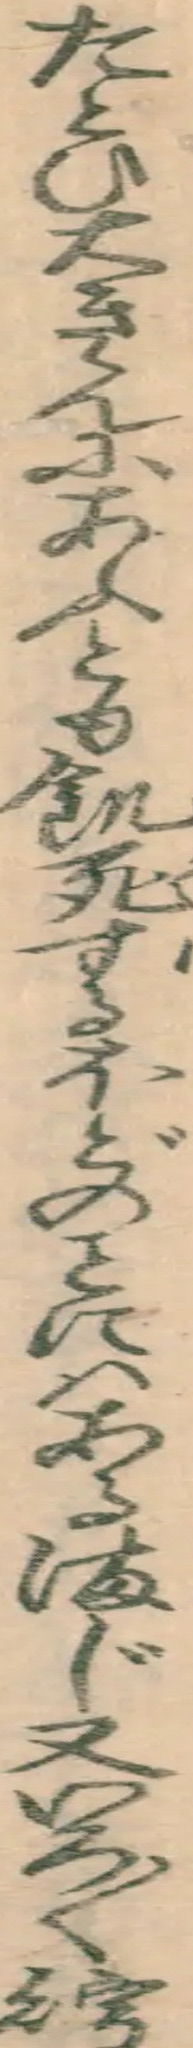たとひ大きゝんにあふとも飢死するほどのことにはあるまじ又いろ〳〵貯
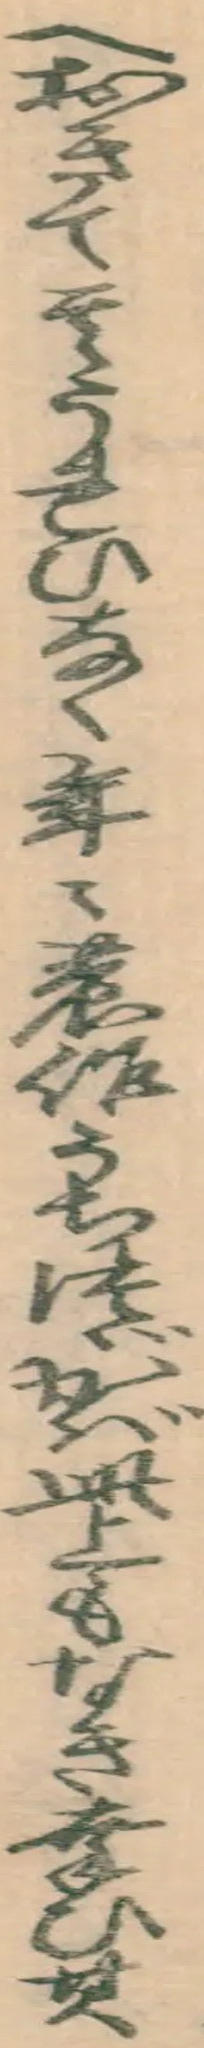へおきて其うれひなく年々豊作うちつゞかば此上もなき幸ひ其

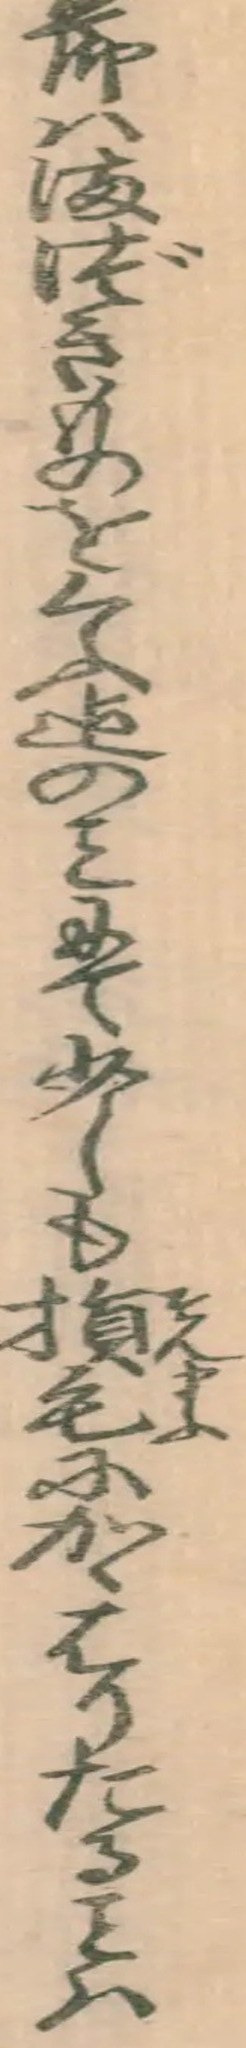節はまづきものをくふ迄のことにて少しも損毛にかゝはりたることは
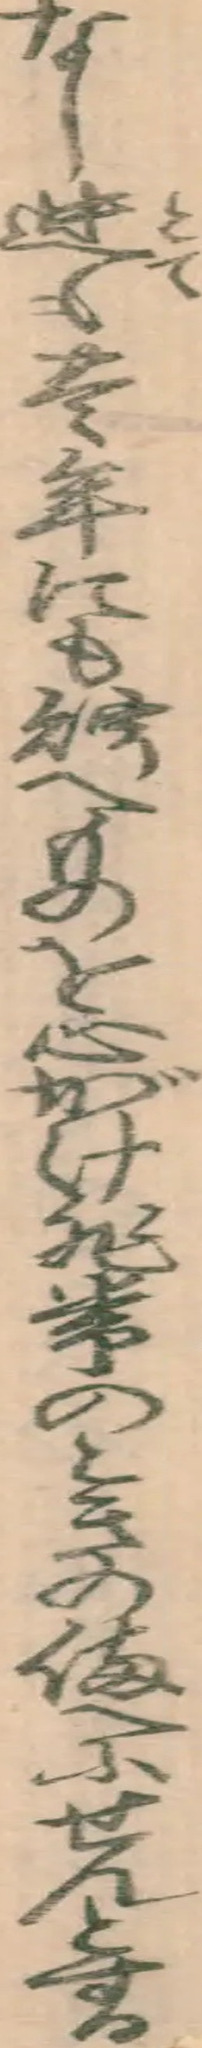なし迚も豊年にも貯へものを心がけ非常のときの備へにせんとする
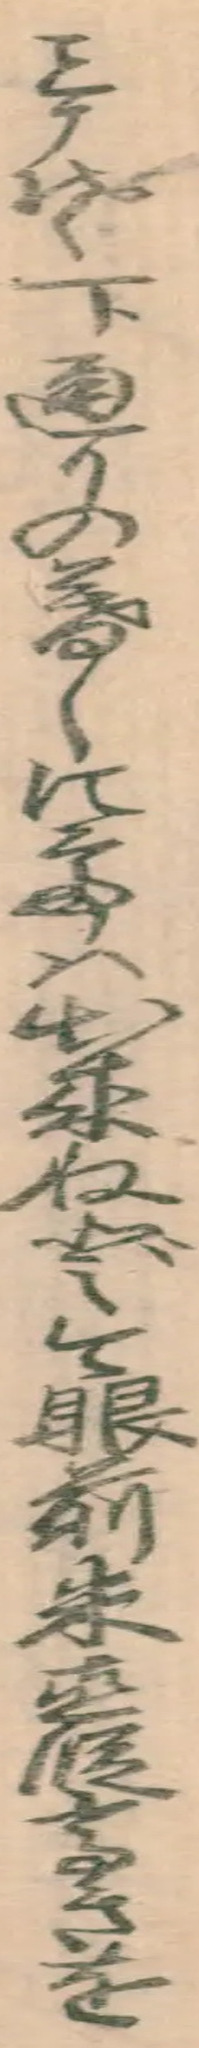ことこそ一ㇳ通りの暮しにては出来ねど今眼前米直段高きを
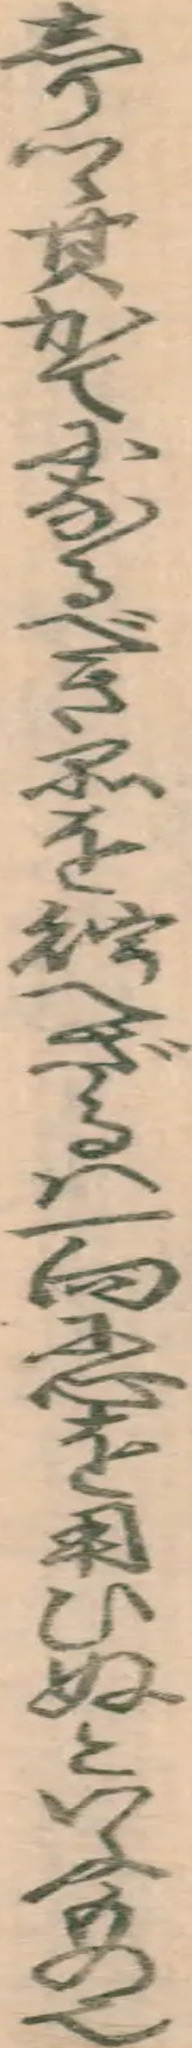しりつゝ其かてになるべき品を貯へざるは一向に心を用ひぬといふもの也
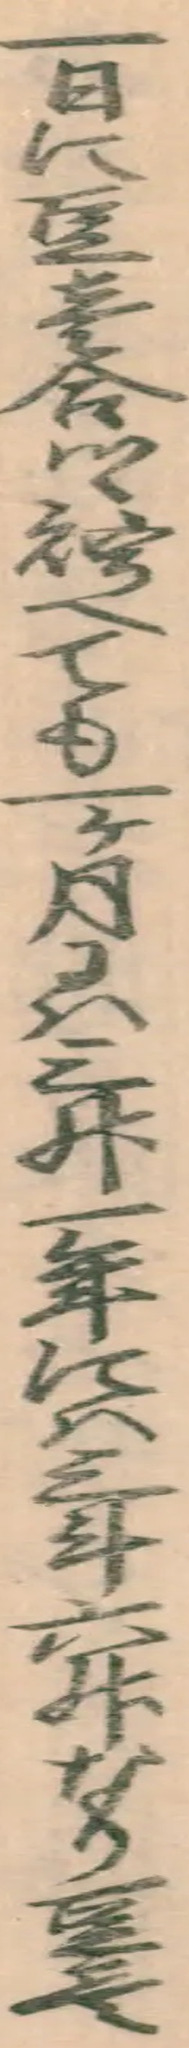一日に豆壱合つゝ貯へても一ヶ月には三升一年には三斗六升なり豆壱
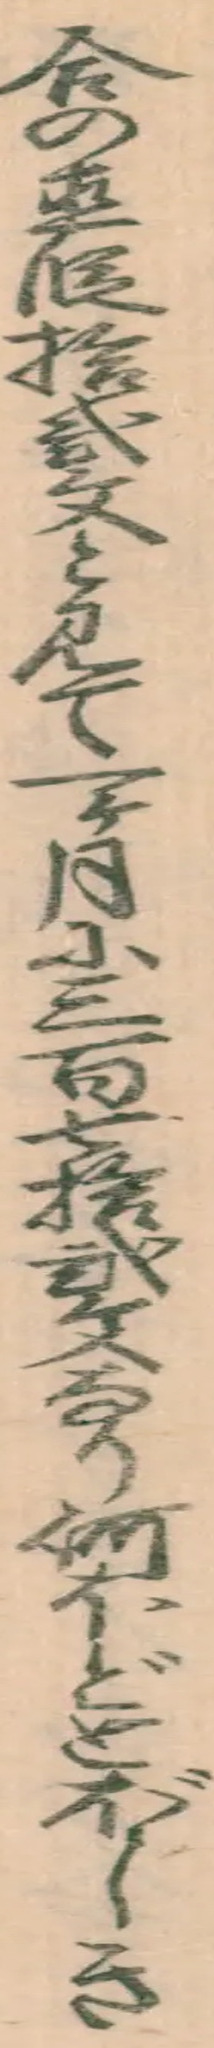合の直段拾弐文と見て一ヶ月に三百七拾弐文なり何ほどとぼしき
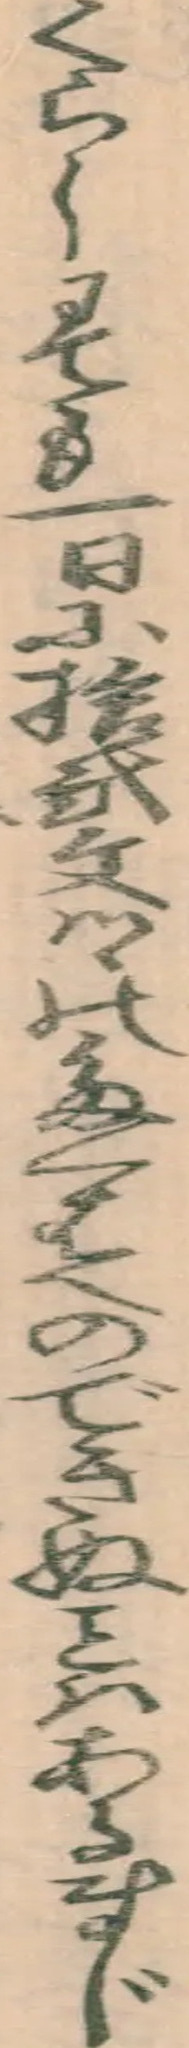くらしにても一日に拾弐文つゝのたくはへのできぬことはあるまじ
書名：日ごとの心得
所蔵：国立国会図書館 National Diet Library, JAPAN
